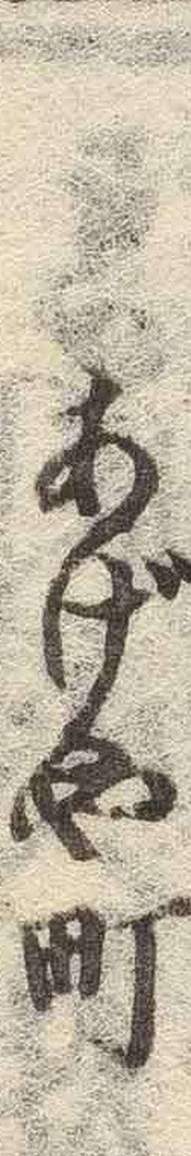あげや町
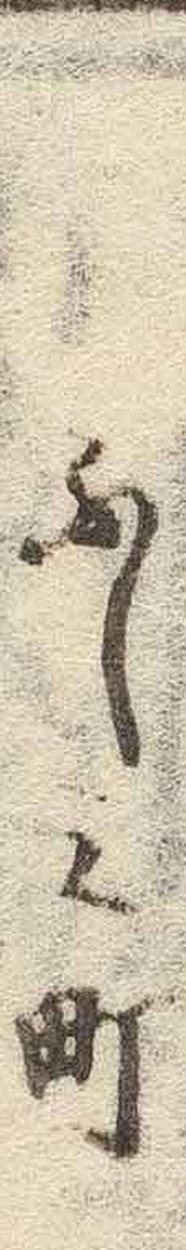ふしみ町
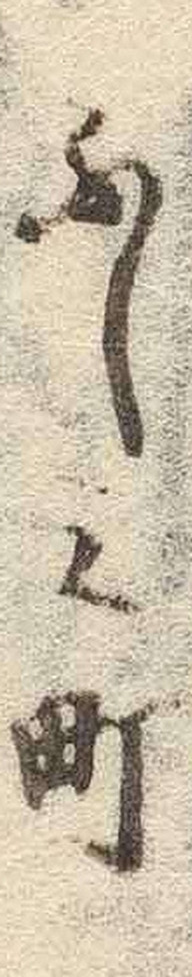ふしみ町
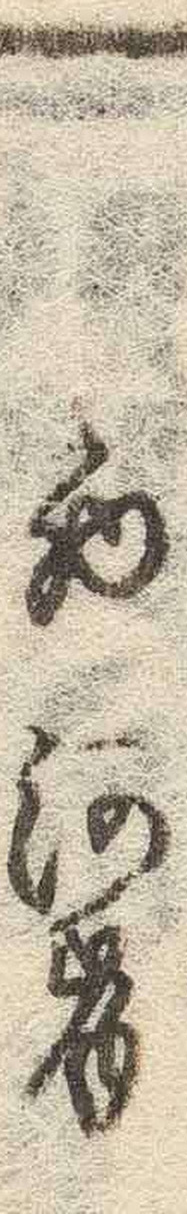西河岸
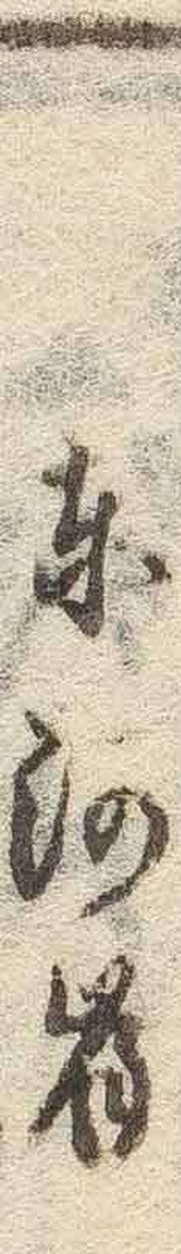東河岸
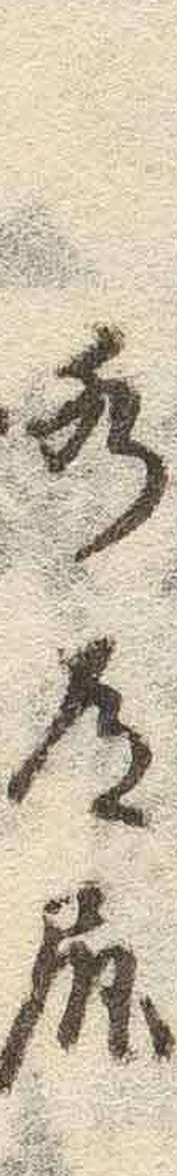水道尻
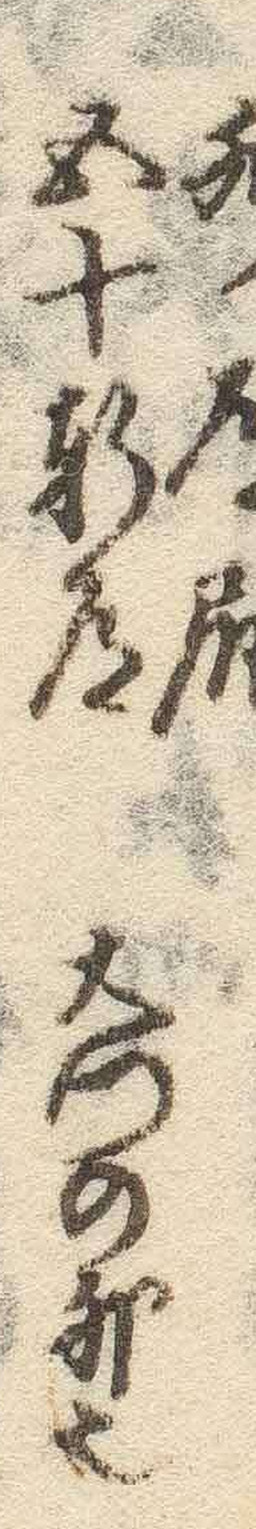五十軒道大門の外也
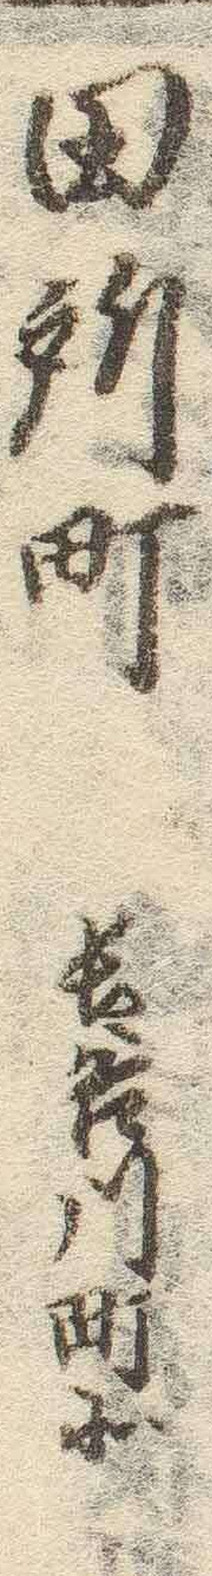田所町長谷川町北
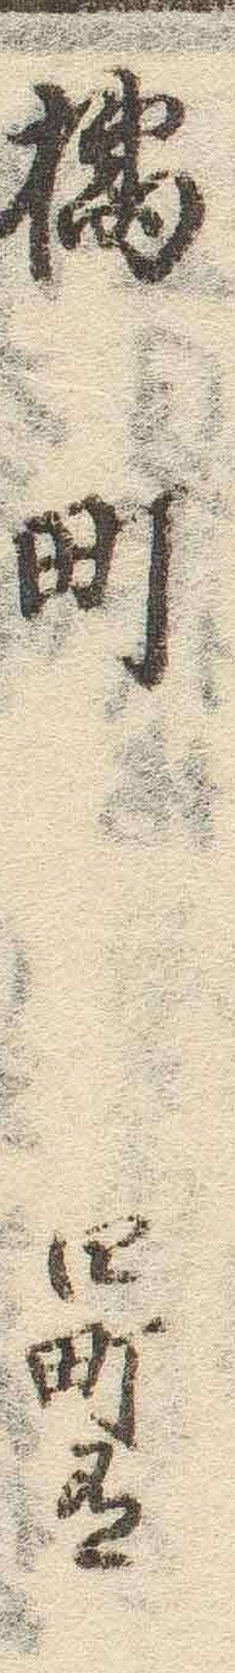橘町四町有
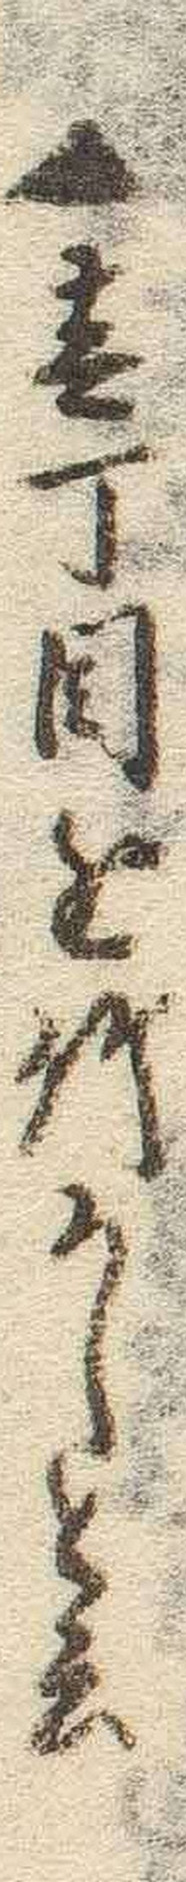▲壱丁目を竹かしと云
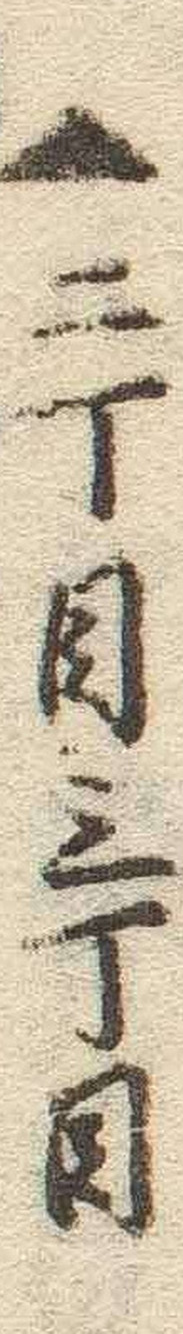▲二丁目三丁目
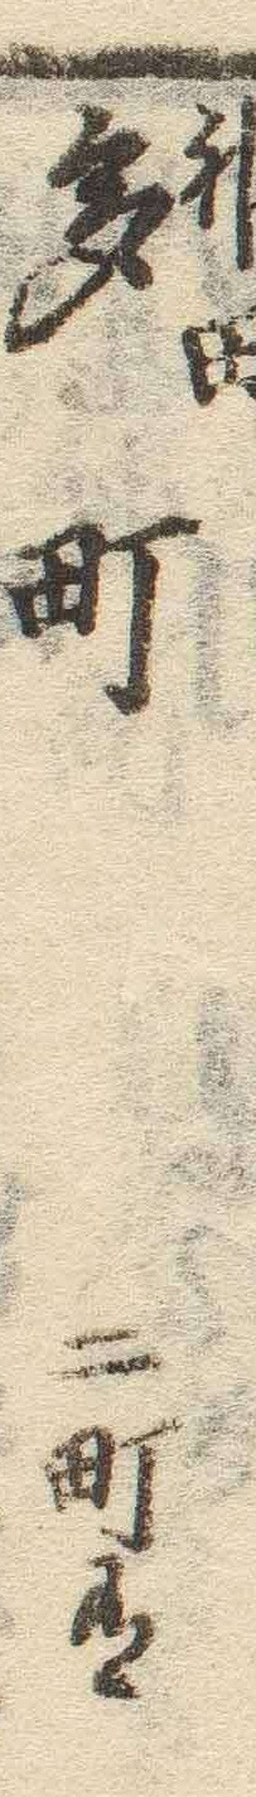多町二町有
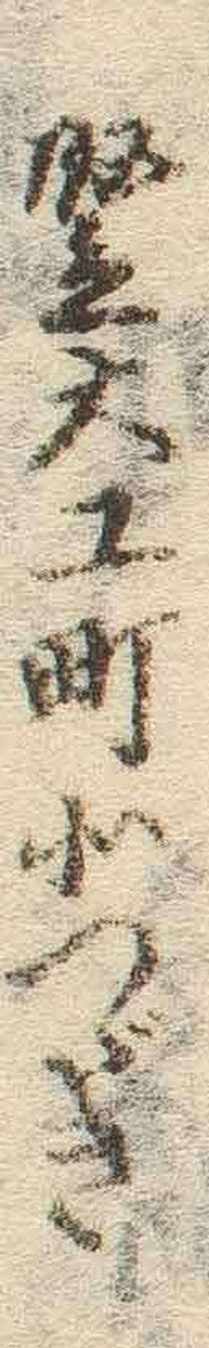竪大工町北つゞき
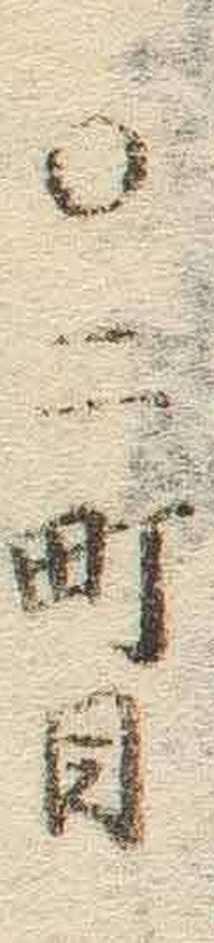◦二町目
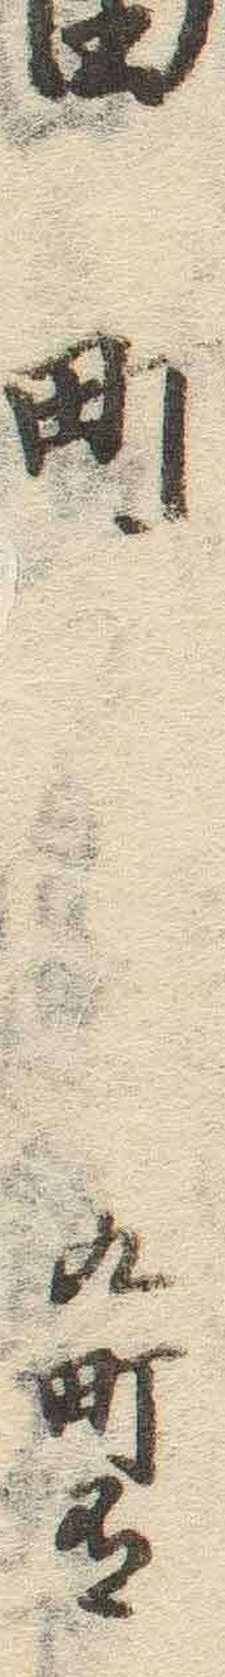田町九町有
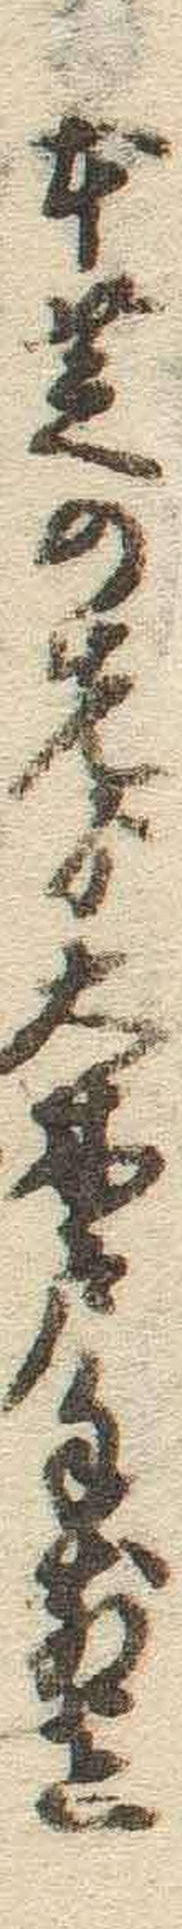本芝の先ゟ大木戸手前迄
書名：江戸町独案内
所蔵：東京学芸大学附属図書館 国文学研究資料館
